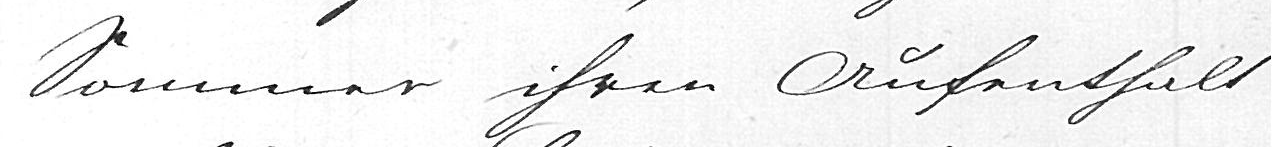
Sommer ihren Aufenthalt
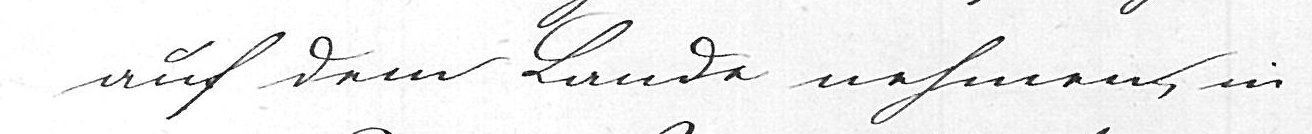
auf dem Lande nehmen, in
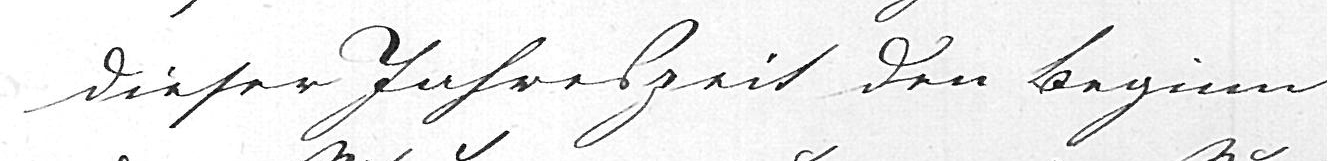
dieser Jahreszeit den Beginn
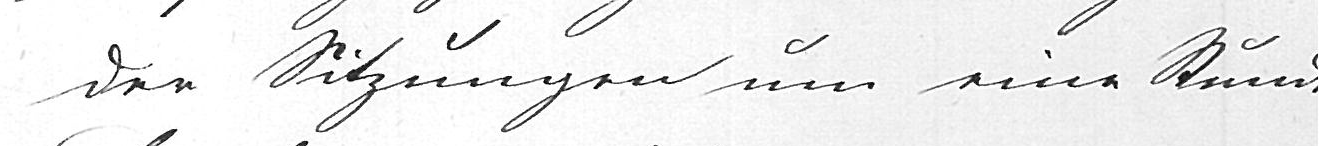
der Sitzungen um eine Stunde
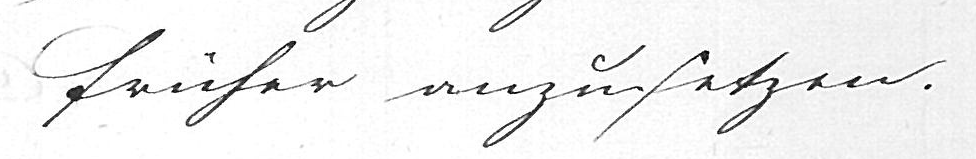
früher anzusetzen.
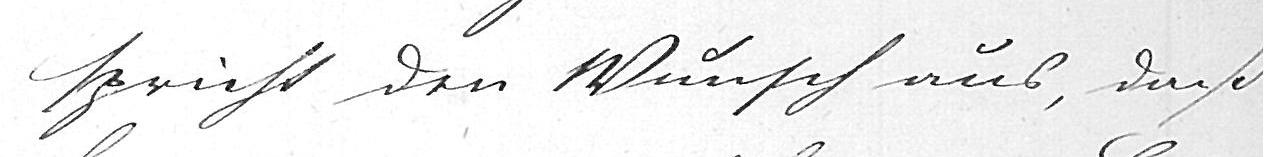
spricht den Wunsch aus, daß
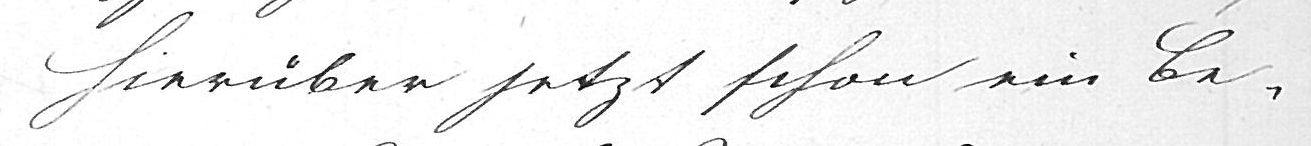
hierüber jetzt schon ein Be-
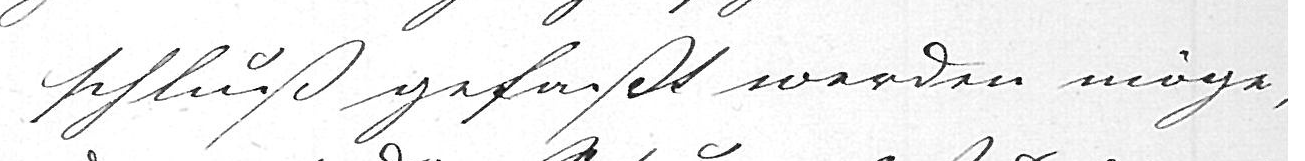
schluß gefaßt werden möge,
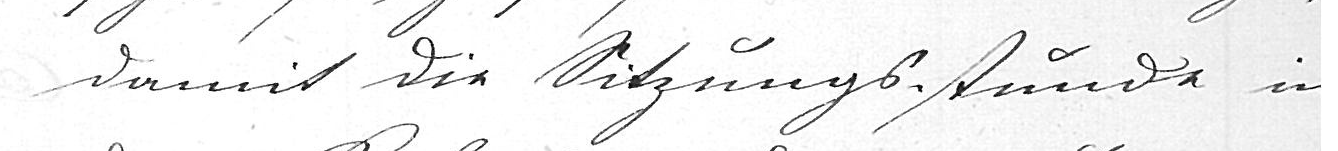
damit die Sitzungsstunde in
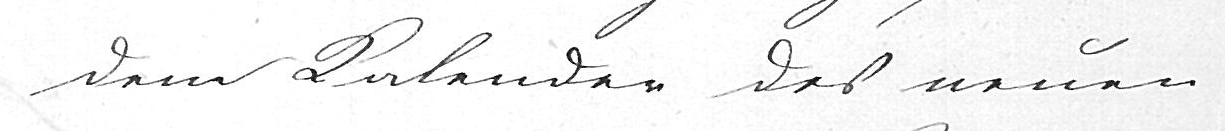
dem Kalender des neuen
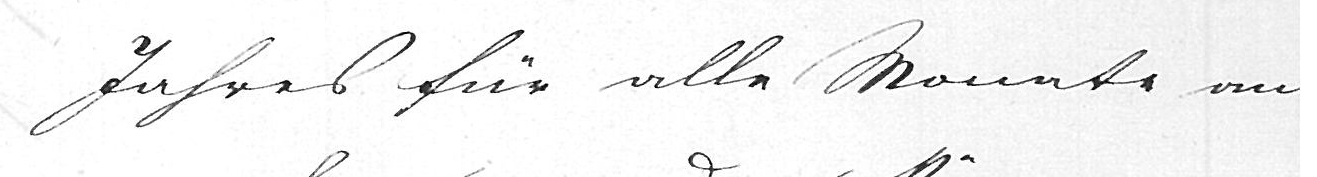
Jahres für alle Monaten an-
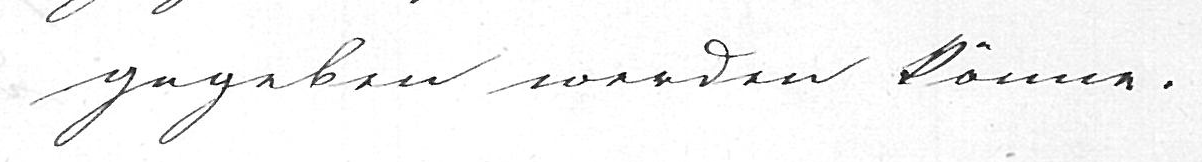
gegeben werden könne.
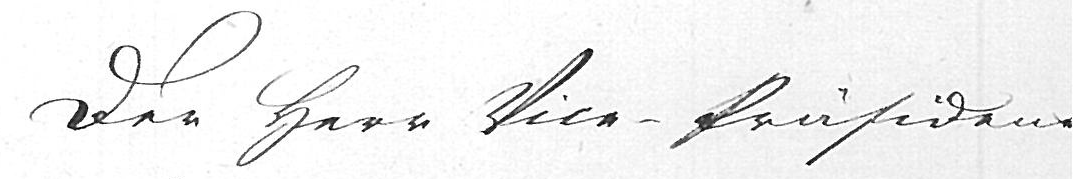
Der Herr Vice-Präsident
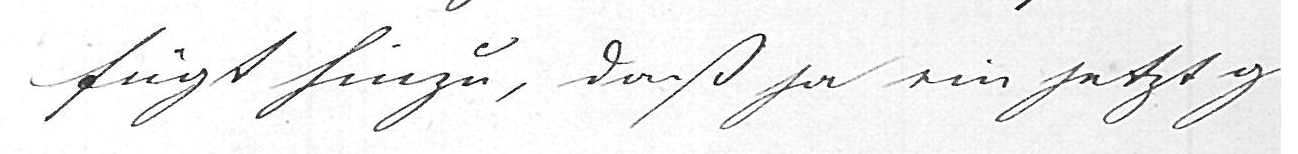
fügt hinzu, daß ja ein jetzt ge-
